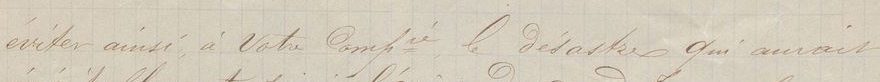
éviter ainsi, à votre Compie le désastre qui aurait
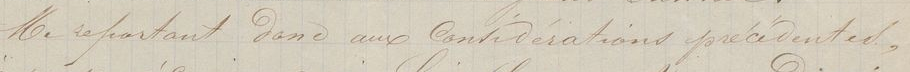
Me reportant donc aux considérations précédentes,
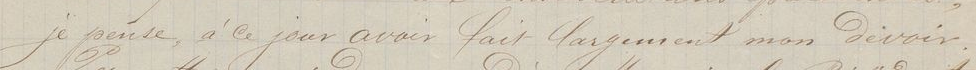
je pense, à ce jour avoir fais largement mon devoir.
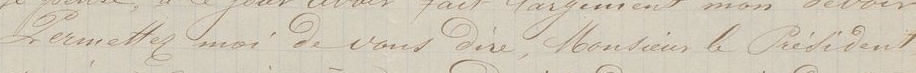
Permettez moi de vous dire, Monsieur le Président,
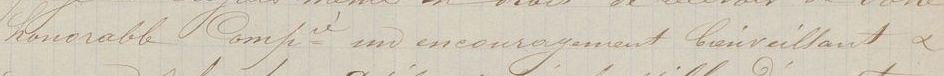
honorable Compie un encouragement bienveillant &
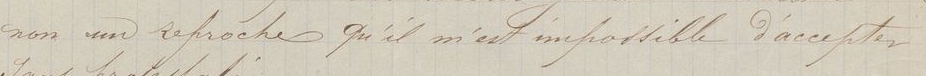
non un reproche qu'il m'est impossible d'accepter
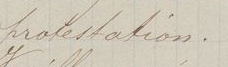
protestation.
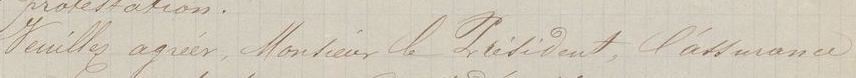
Veuillez agréer, Monsieur le Président, l'assurance
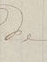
de
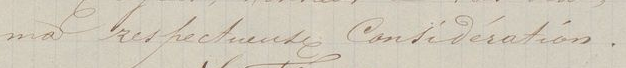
ma respectueuse considération.
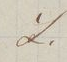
L.
